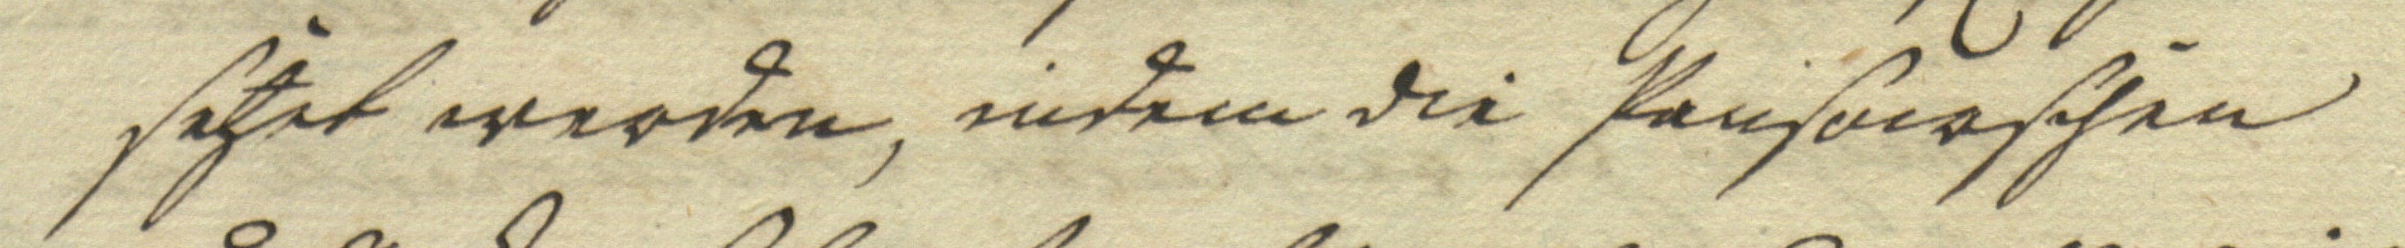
setzet werden, indem die Pansowschen
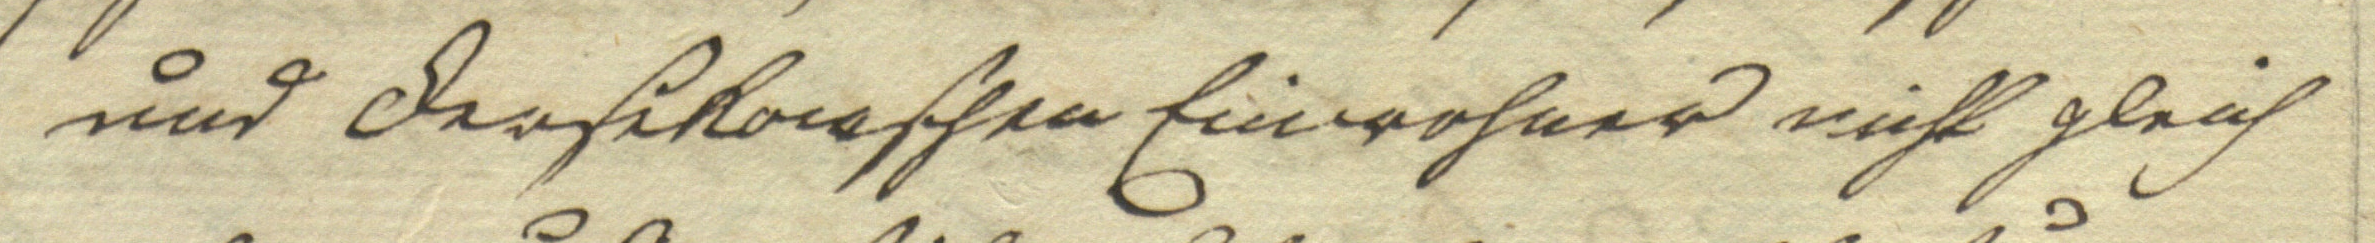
und Dersekowschen Einwohner nicht gleich
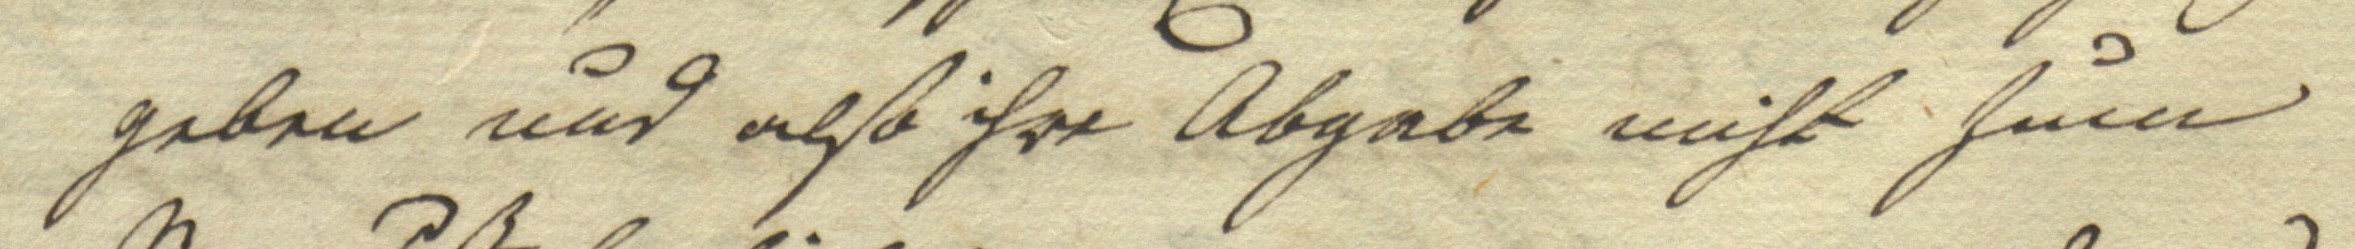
geben und also ihre Abgabe nicht zum
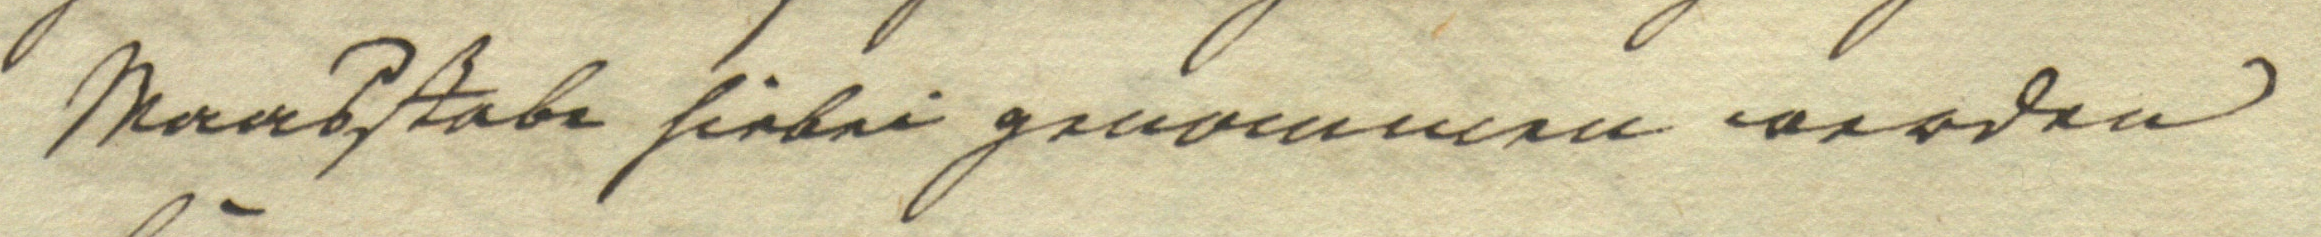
Maasstabe hiebei genommen werden
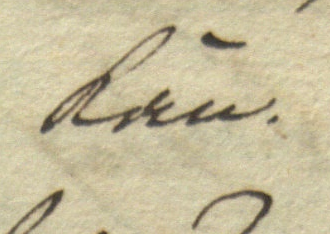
kan.
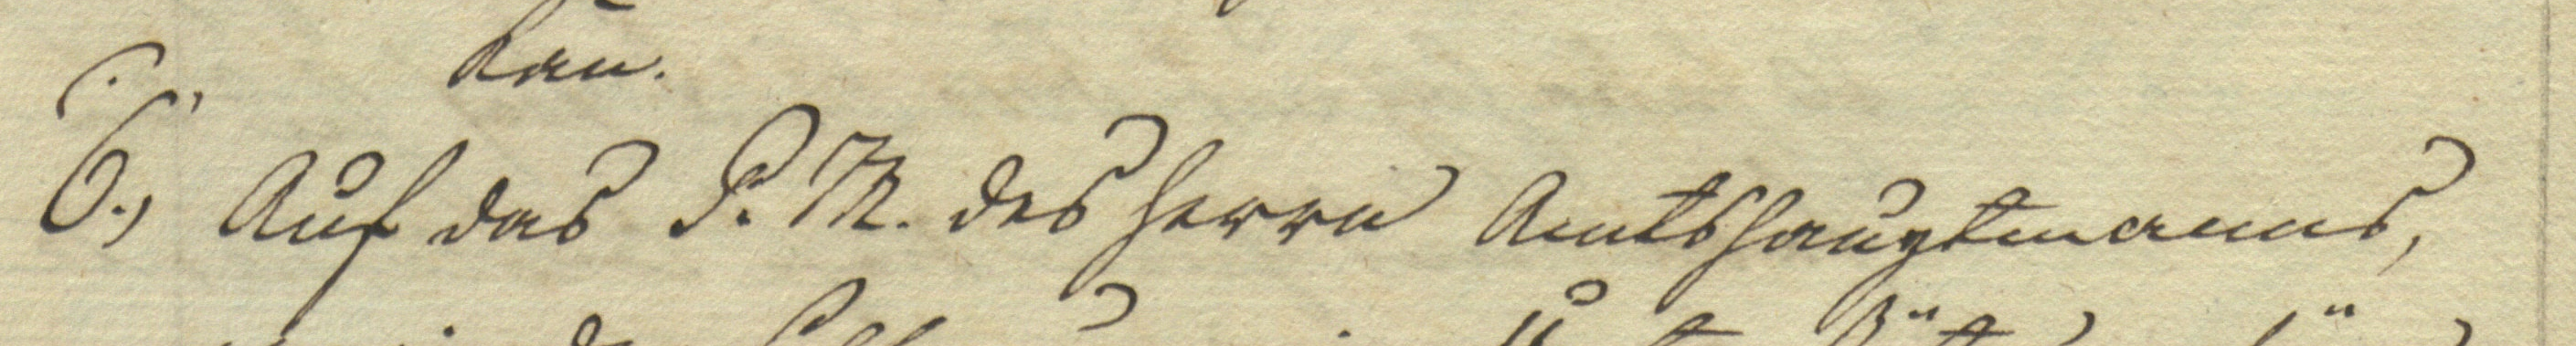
6., Auf das P. M. des Herrn Amtshauptmanns,
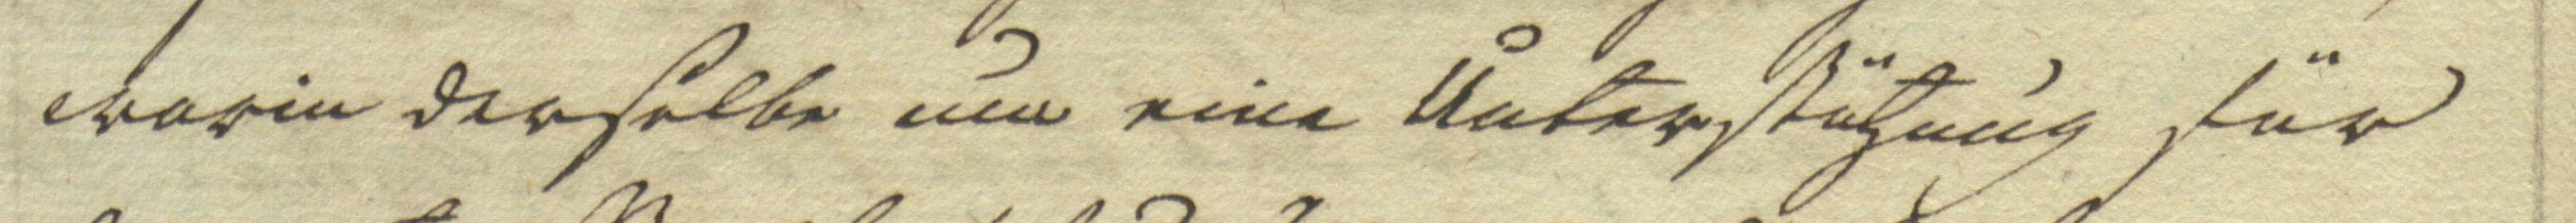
worin derselbe um eine Unterstützung für
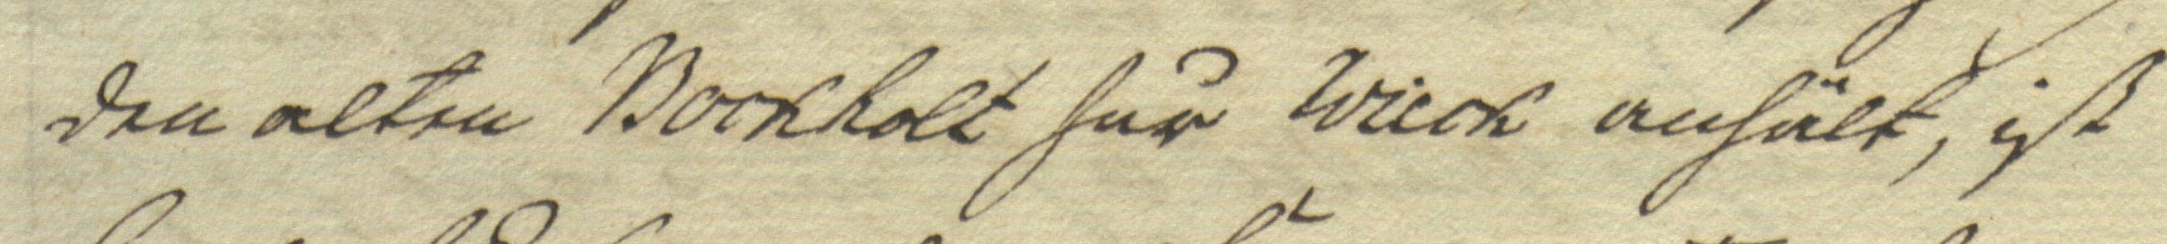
den alten Bockholt zur Wieck anhält, ist
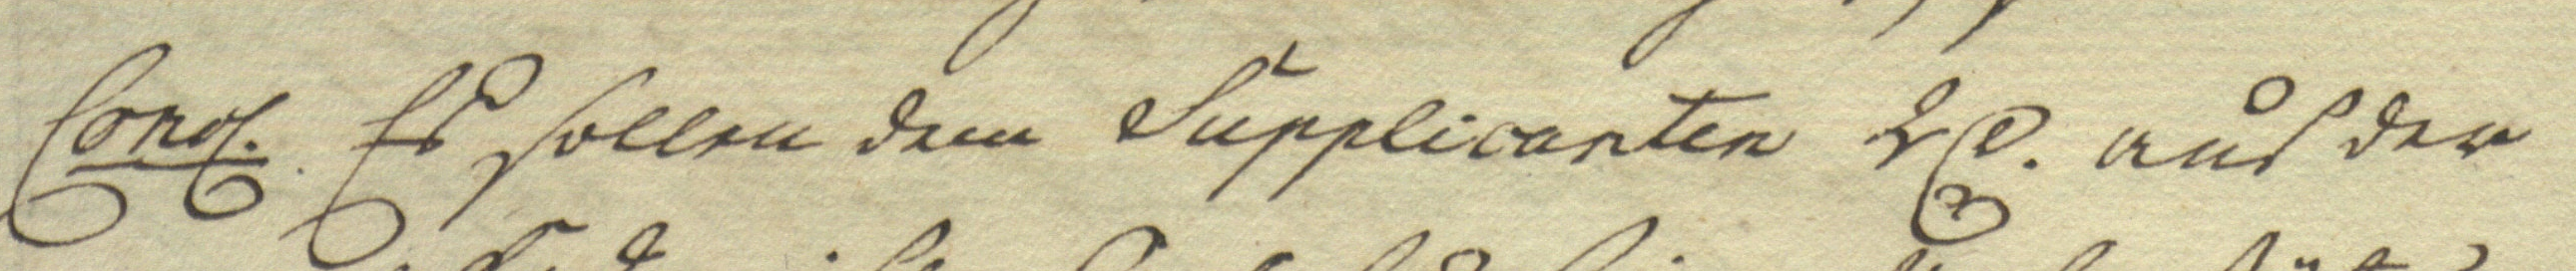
Concl. Es sollen dem Supplicanten 2 l. aus der
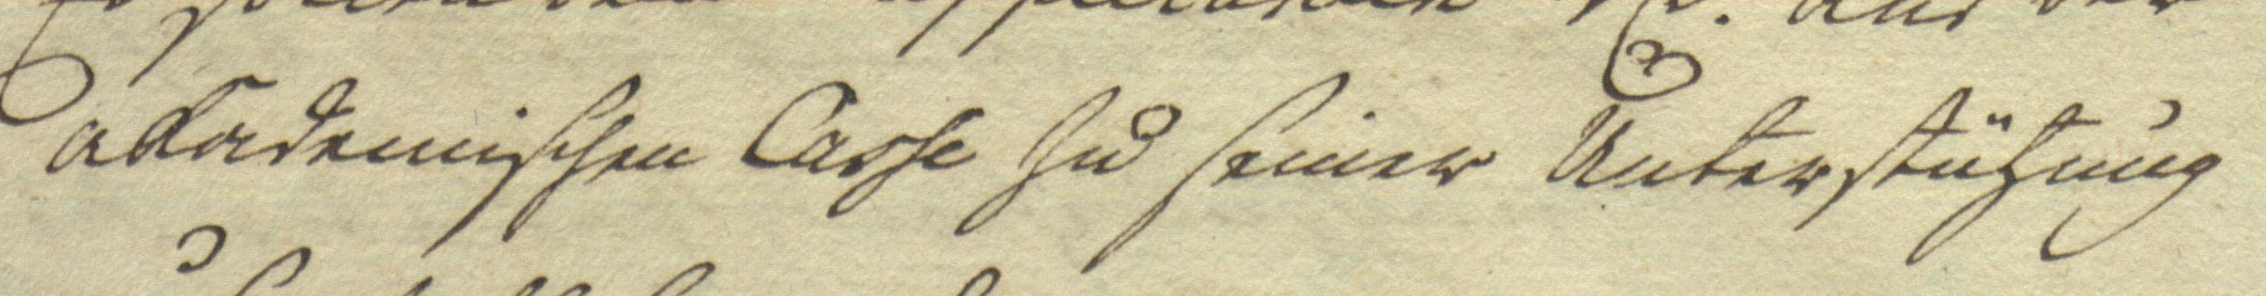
akademischen Casse zu seiner Unterstützung
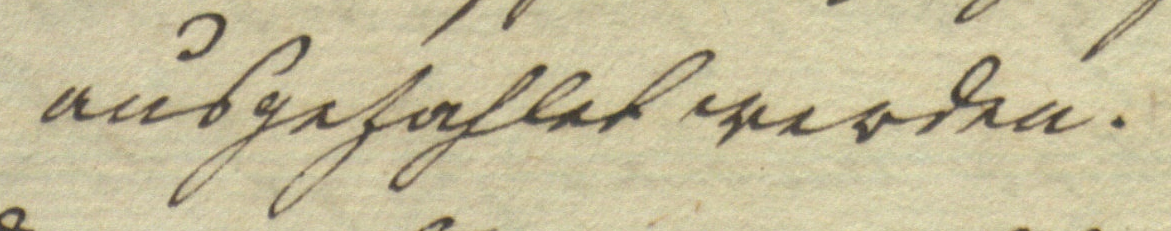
ausgezahlet werden.
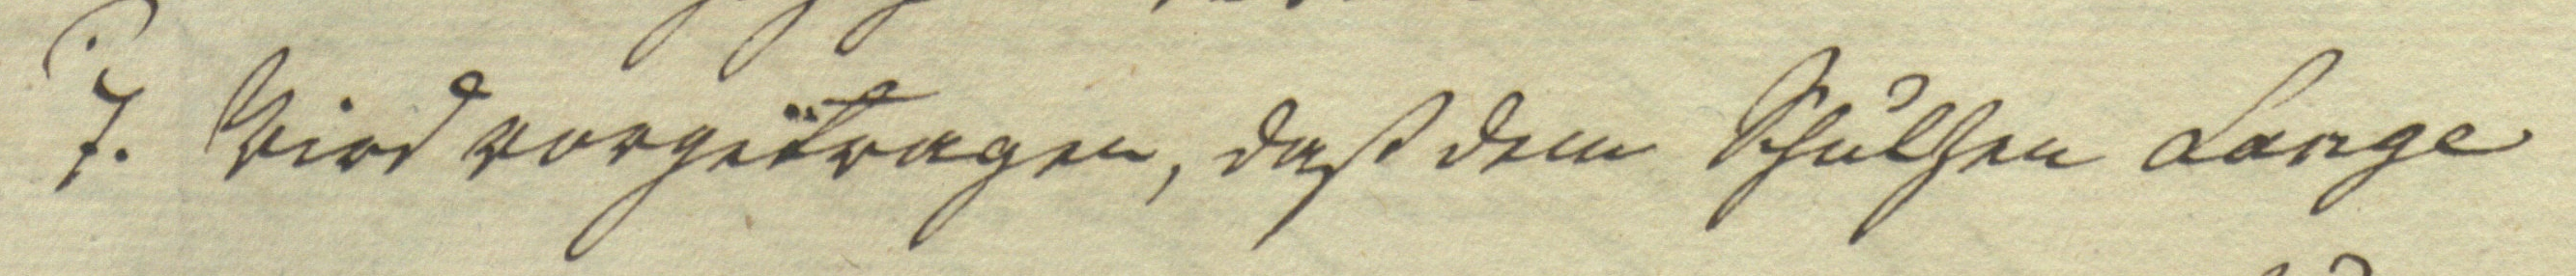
7. Wird vorgetragen, daß dem Schulzen Lange
